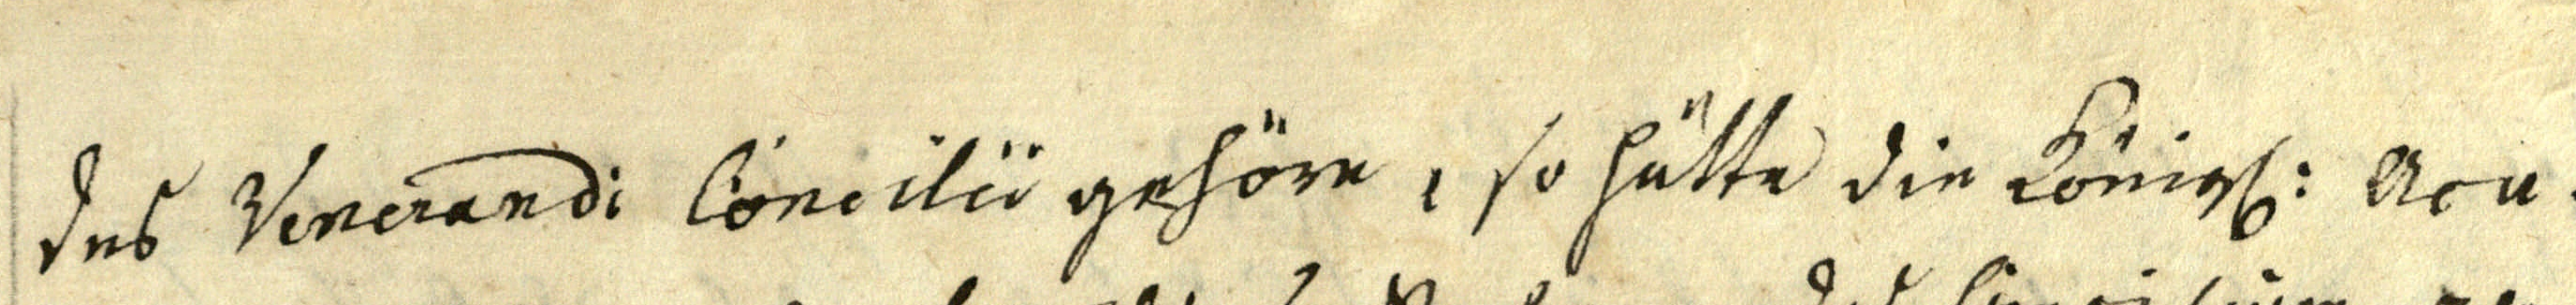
des Venerandi Concilii gehöre, so hätte die Königl. Aca¬
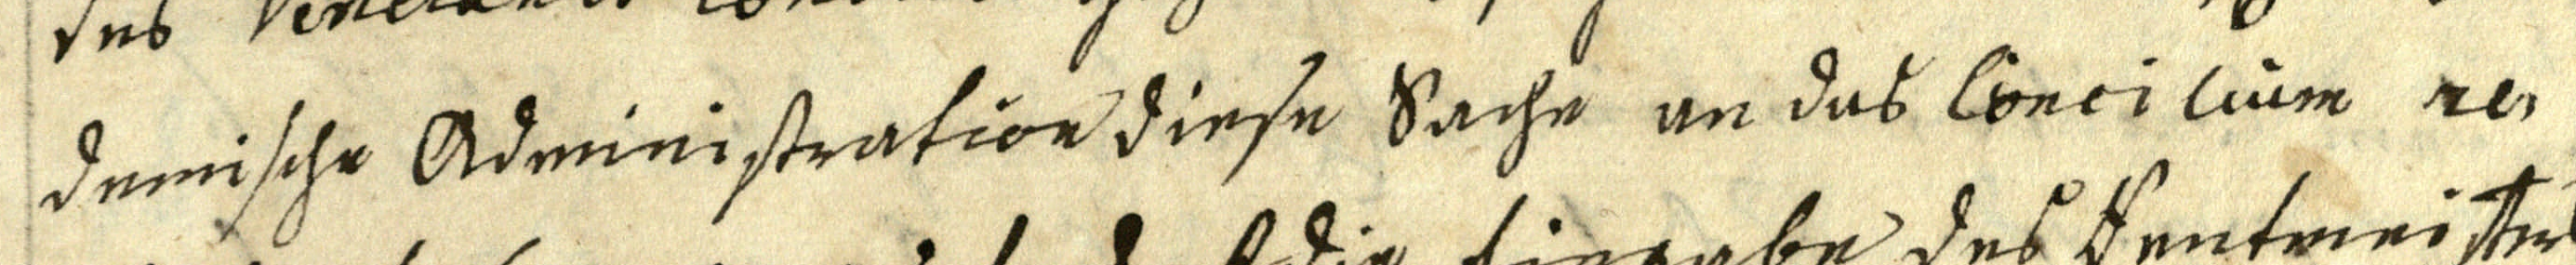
demische Administration diese Sache an das Concilium re¬
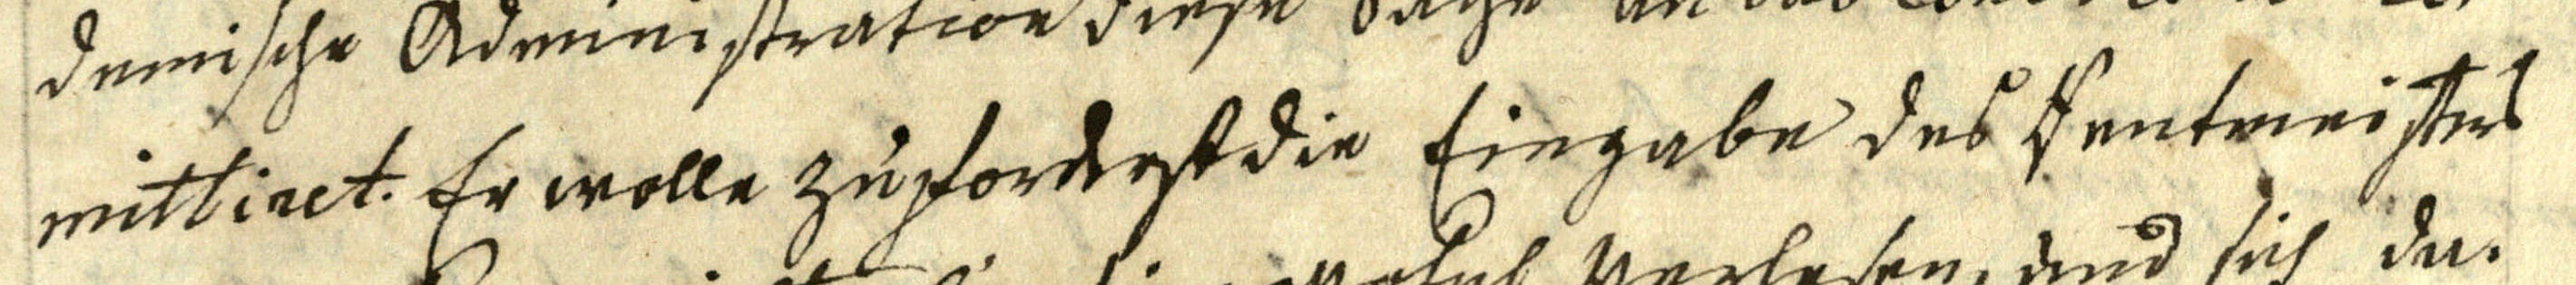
mittiret. Er wolle zuforderst die Eingabe des Rentmeisters
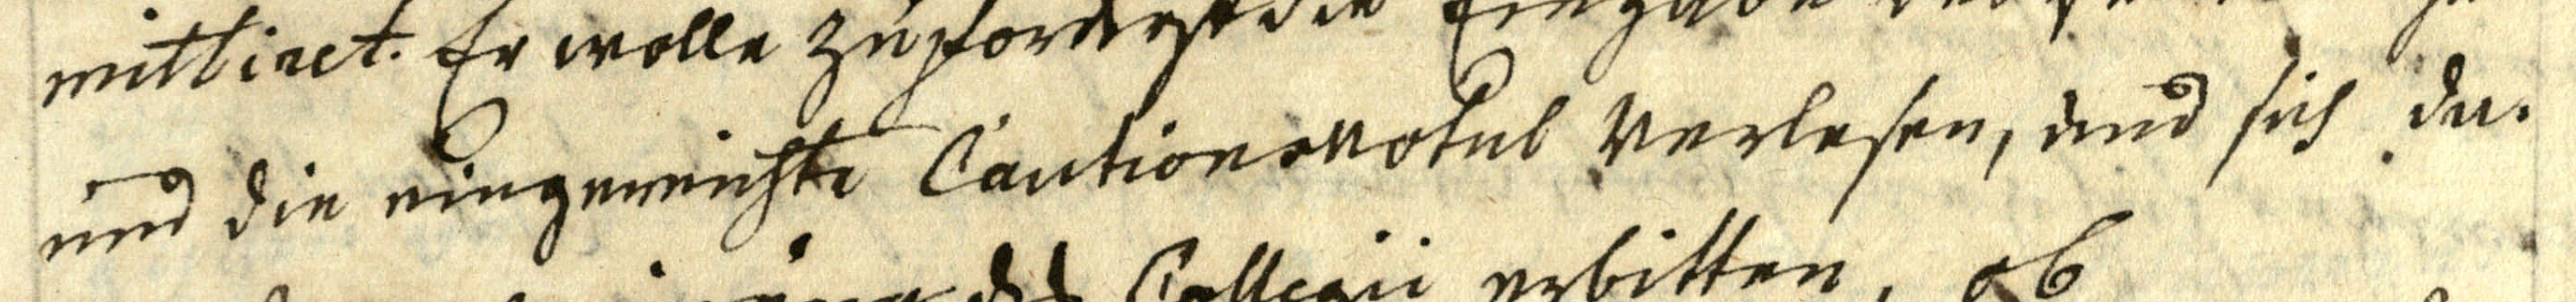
und die eingereichte Cautionsnotul verlesen, und sich da¬
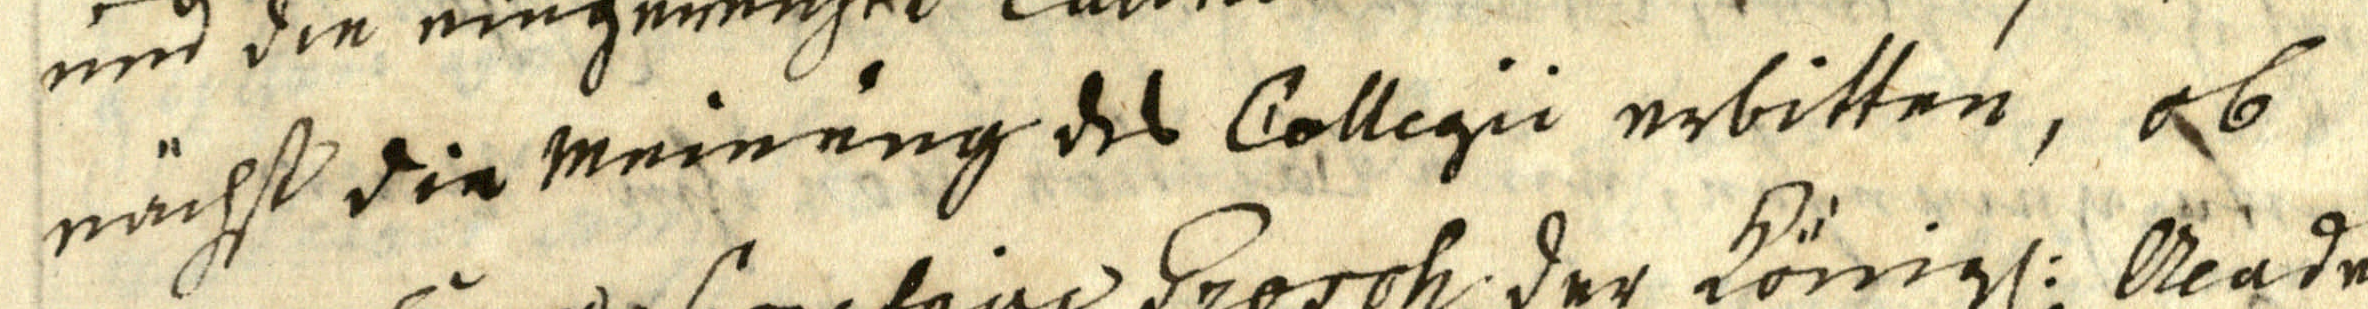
nächst die Meinung des Collegii erbitten, ob
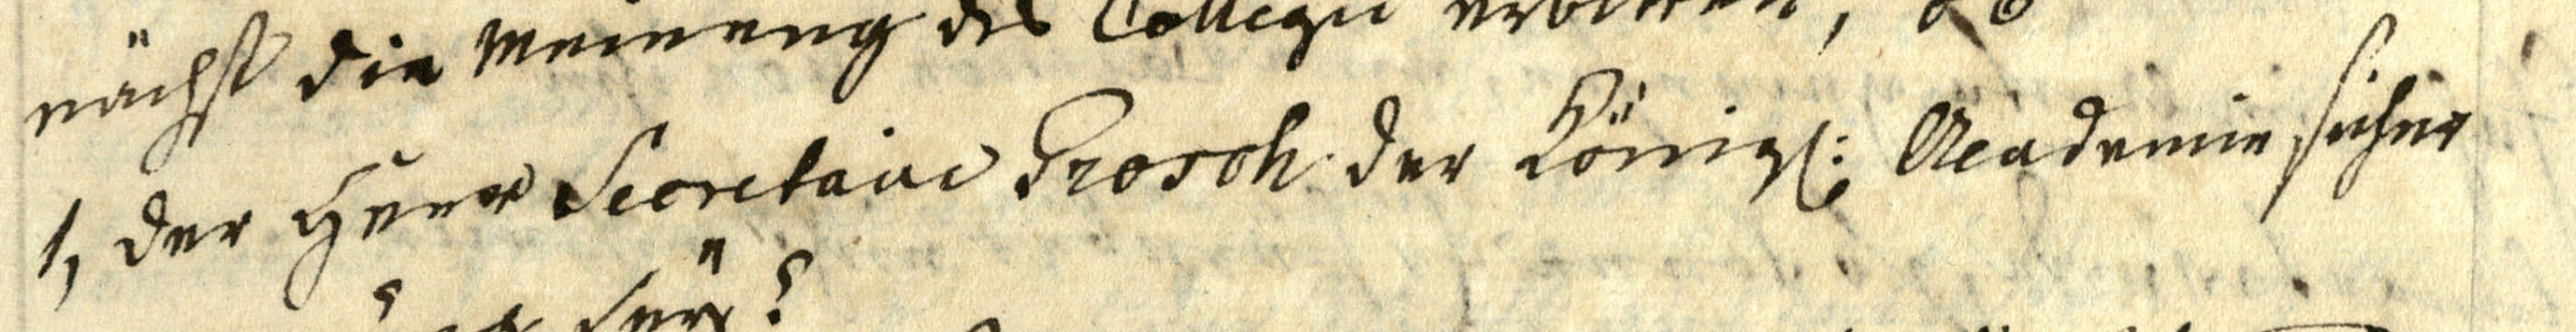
1, der Herr Secretaire Grosch der Königl. Academie sicher
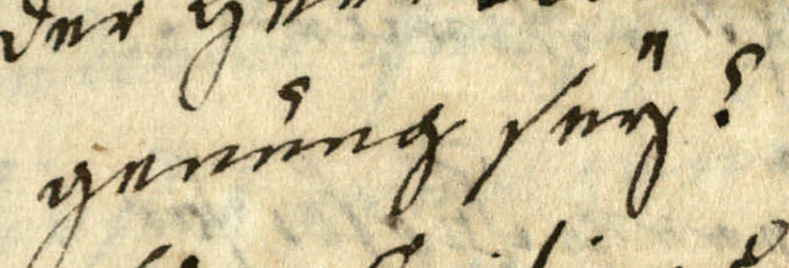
genung seÿ?
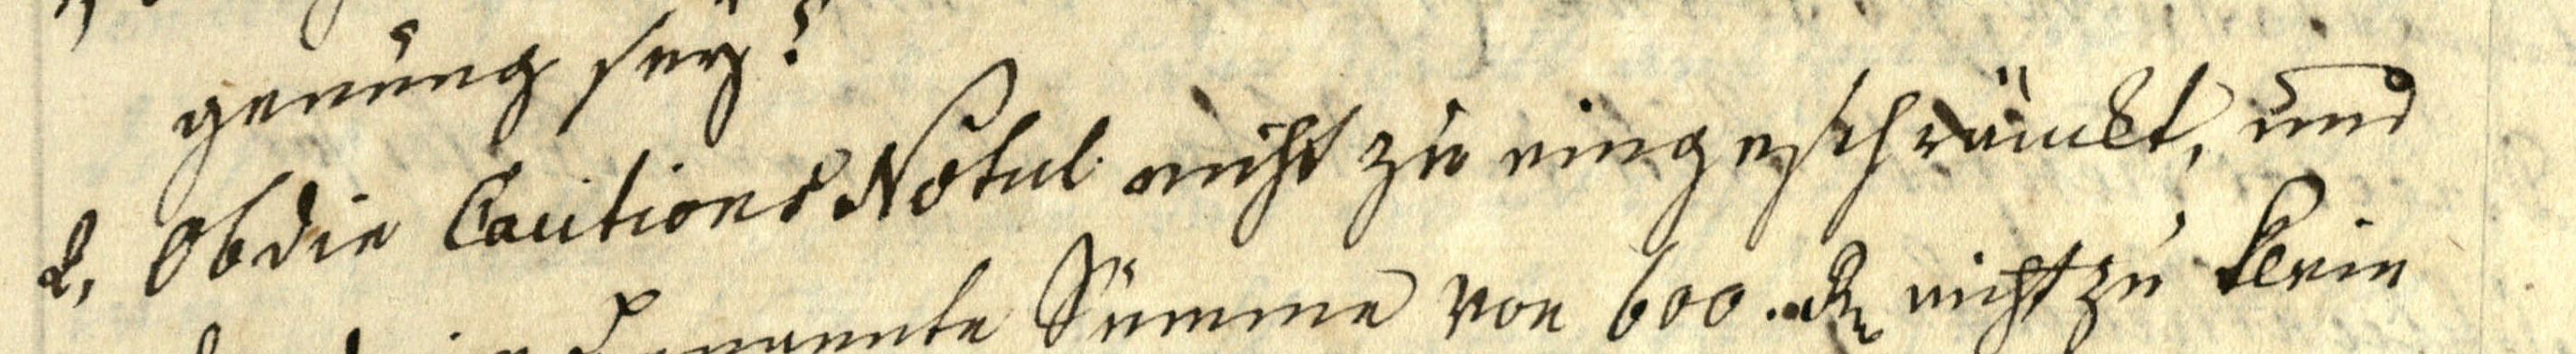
2. Ob die Cautions Notulnicht zu eingeschränkt, und
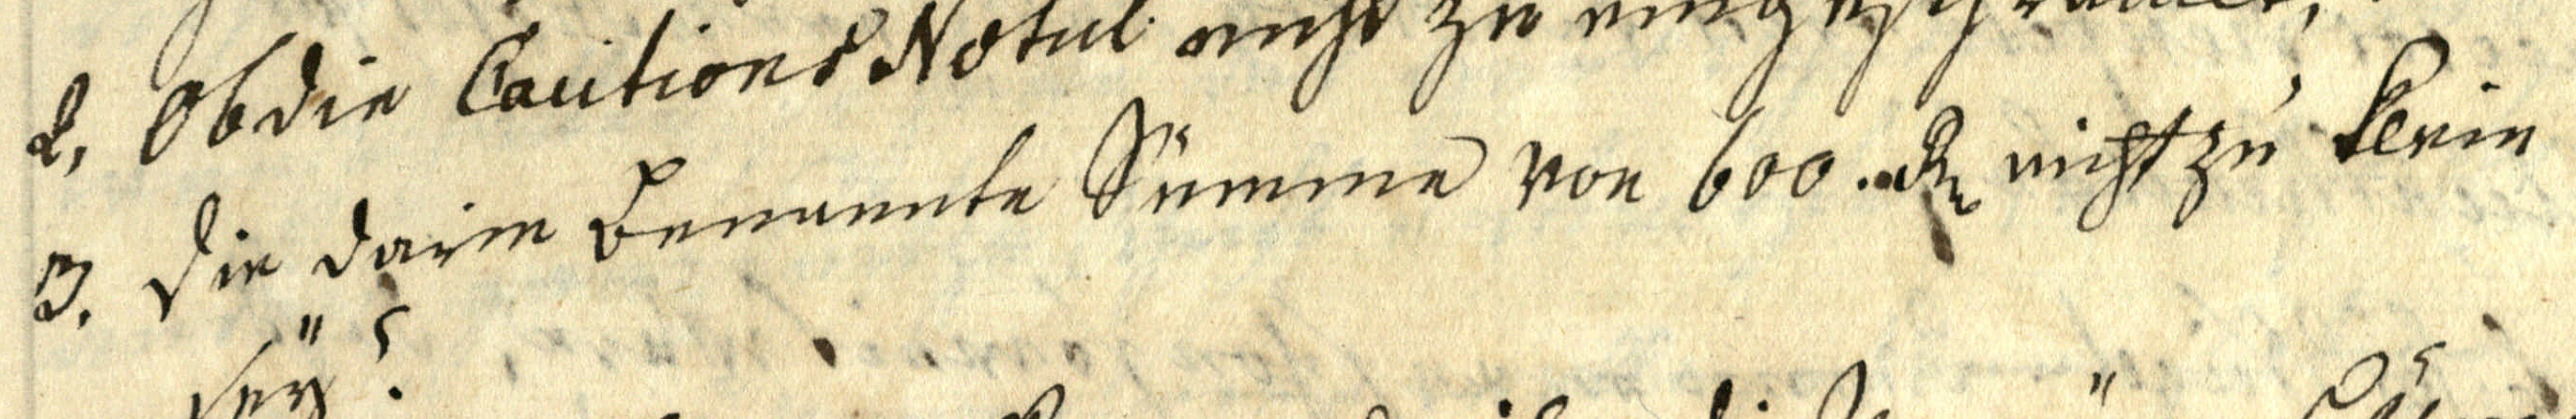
3. die darin benannte Summe von 600 rt nicht zu klein
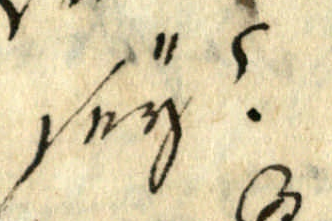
seÿ?
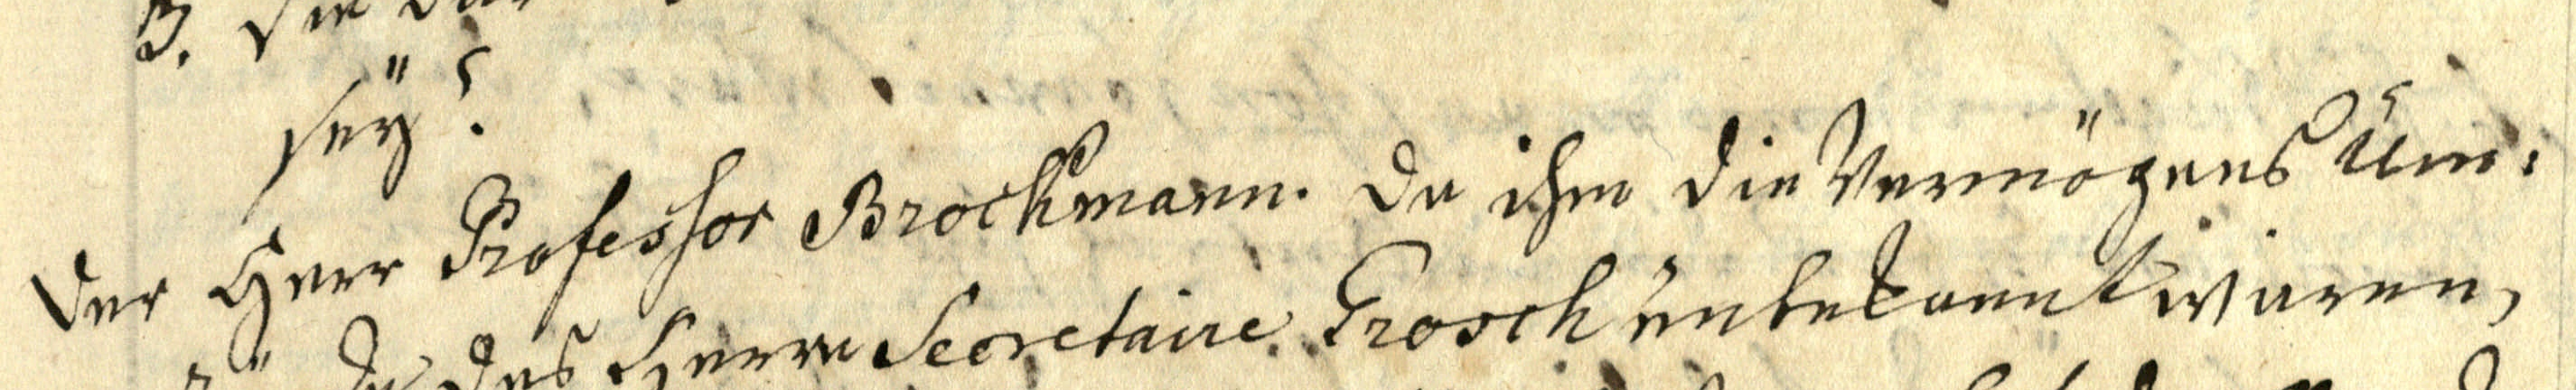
Der Herr Professor Brockmann. Da ihm die VermögensUm¬
